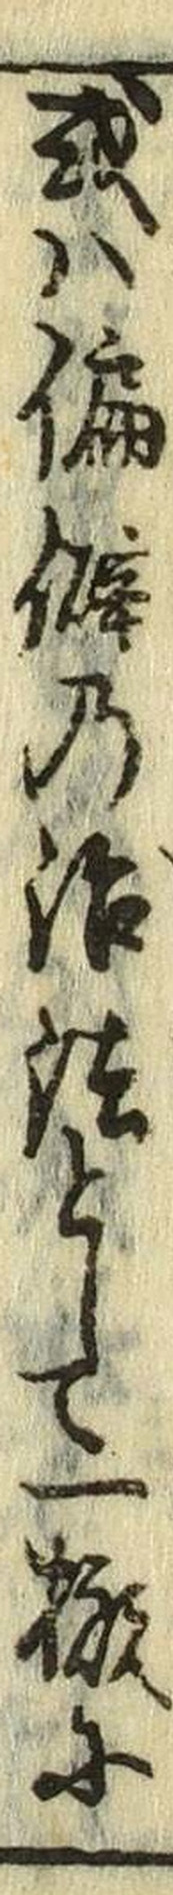或は偏僻の治法として一概に
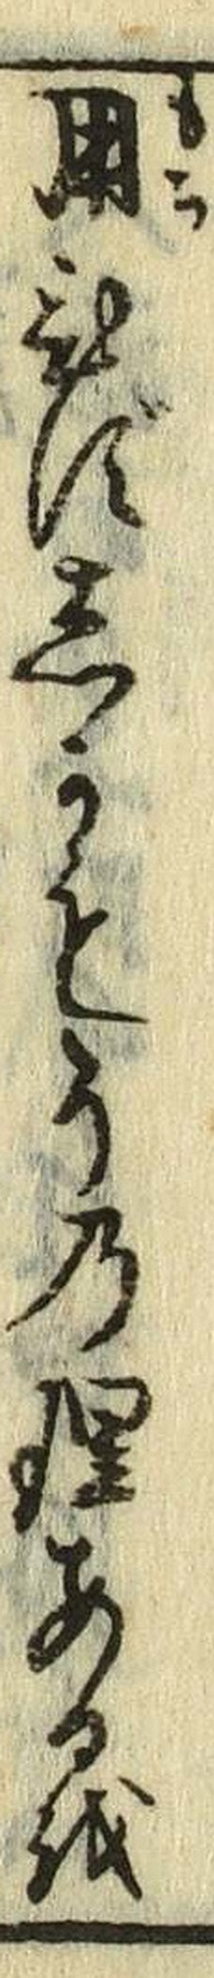用ひずしかもその理あるを
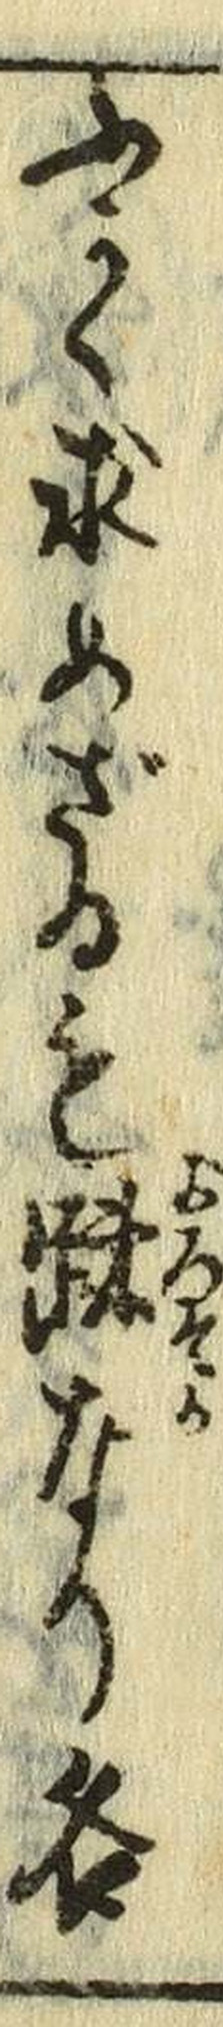ふかく求めざるも疎なり各
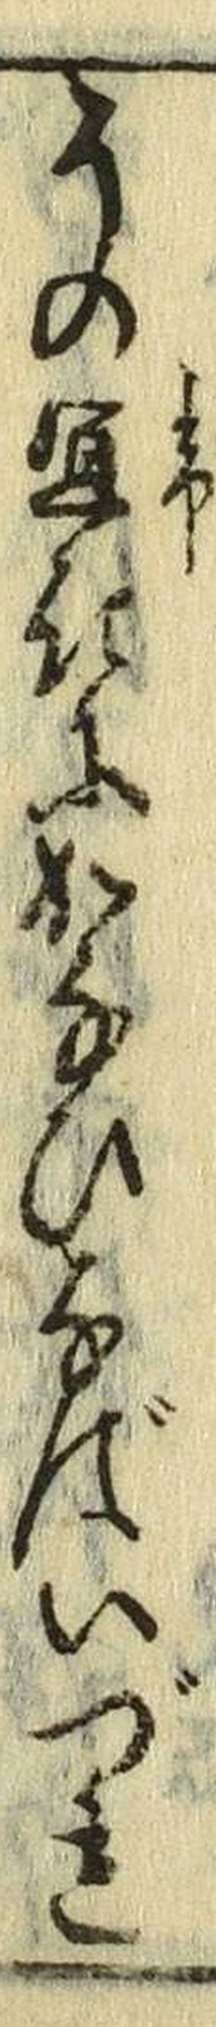その宜きにかなひなばいづれ
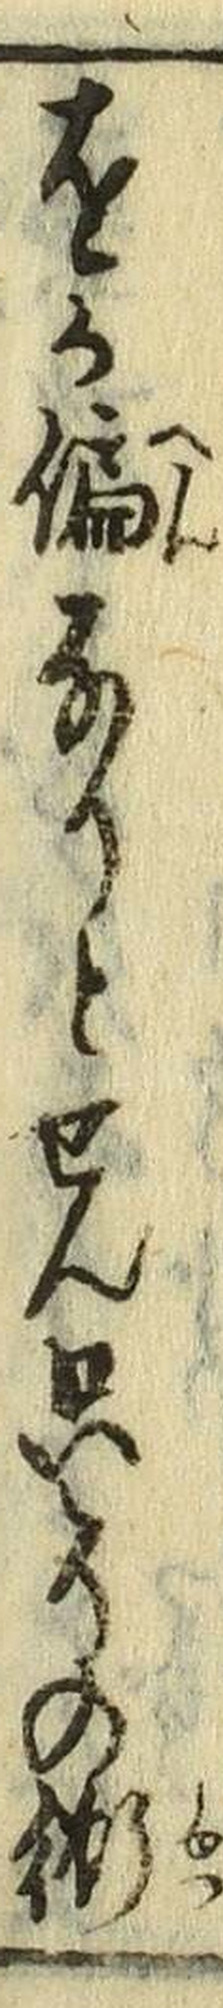をか偏なりとせん只その術
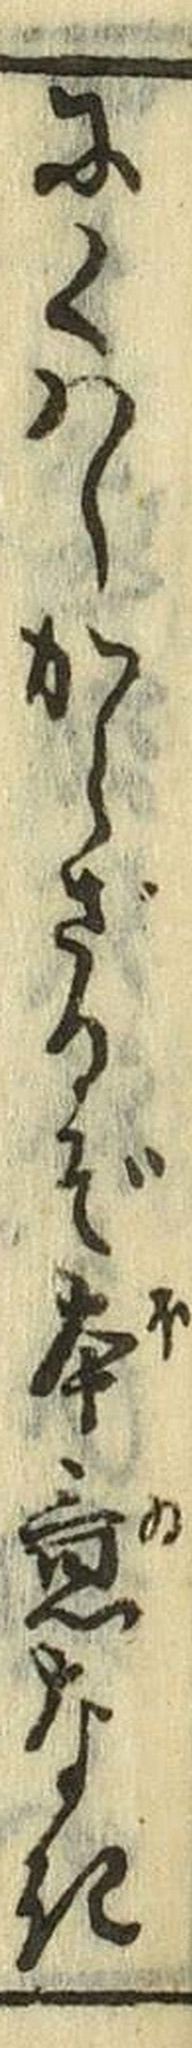にくはしからざるぞ本意なき
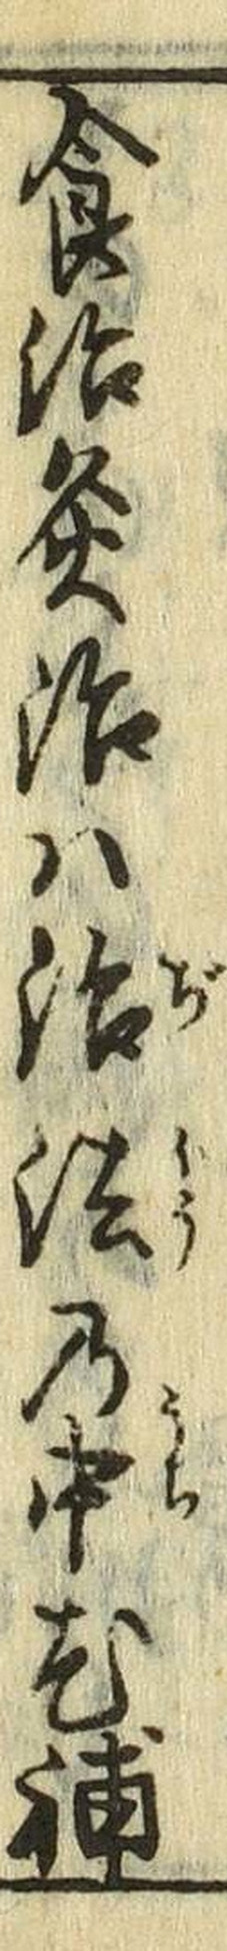食治灸治は治法の中尤補
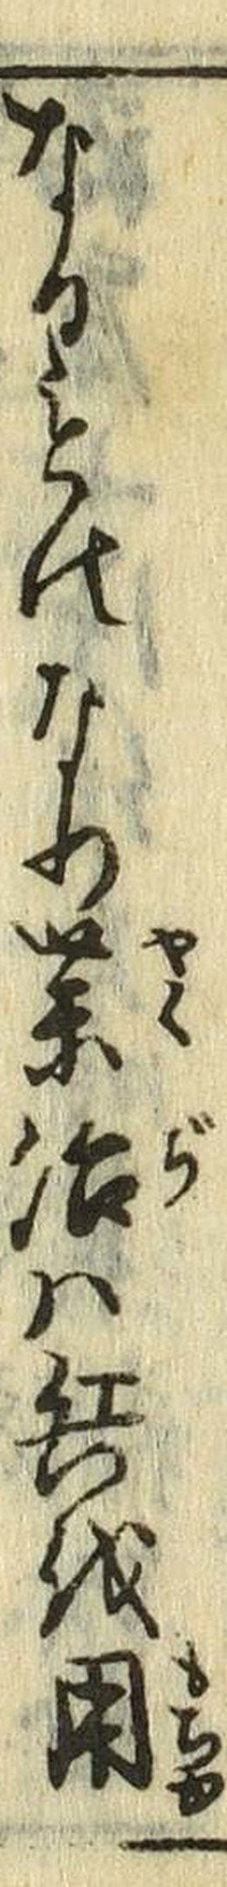なるものなり薬治は兵を用
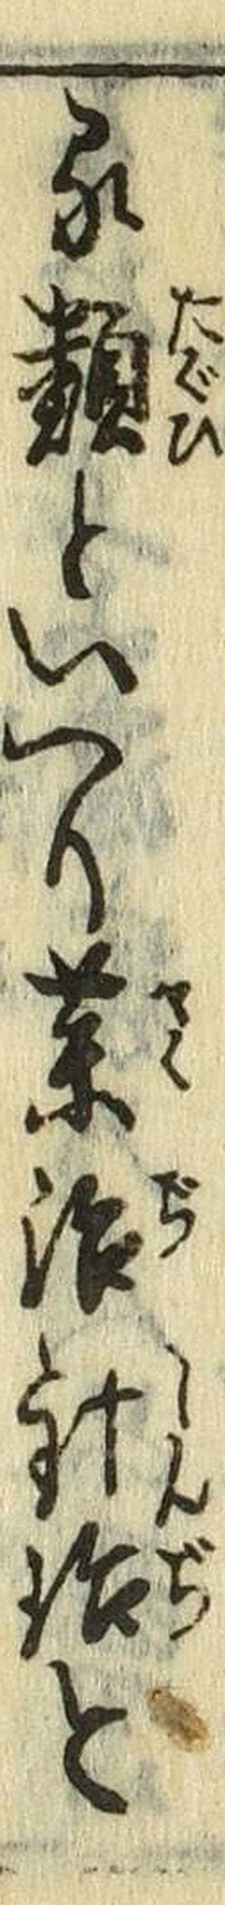る類といへり薬治針治と
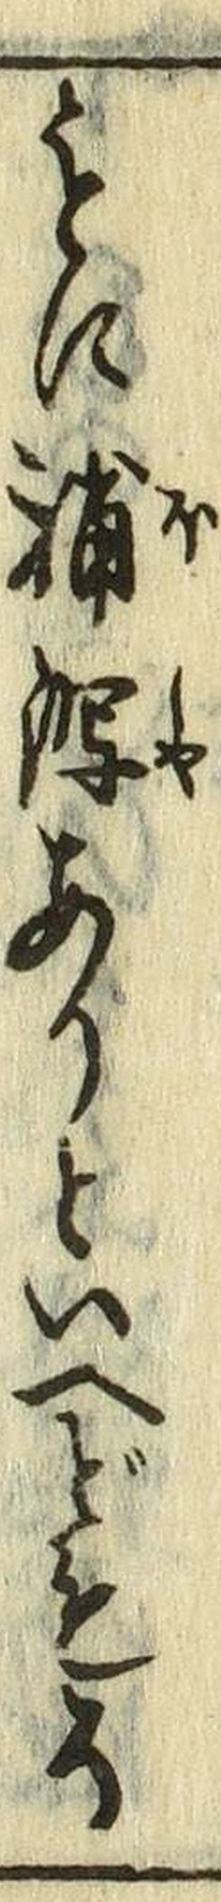もに補瀉ありといへどもそ
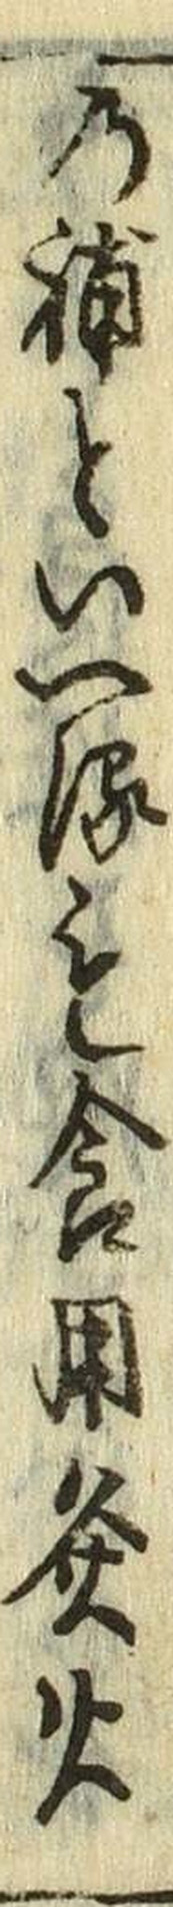の補といへるも食用灸火
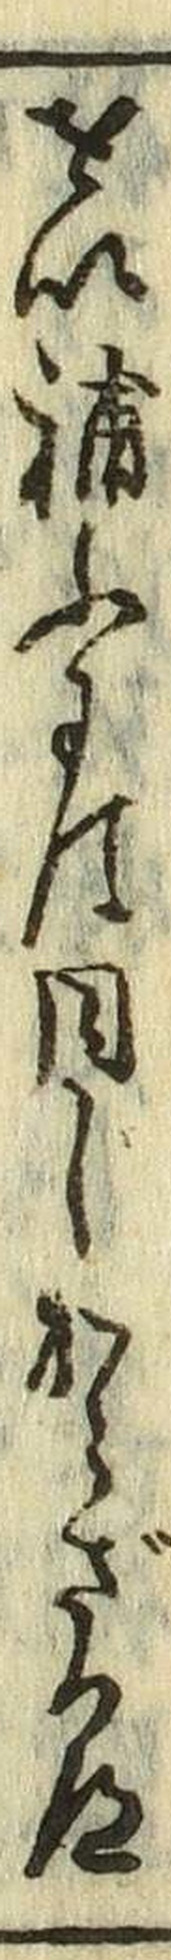を以補ふには同しからざるへ
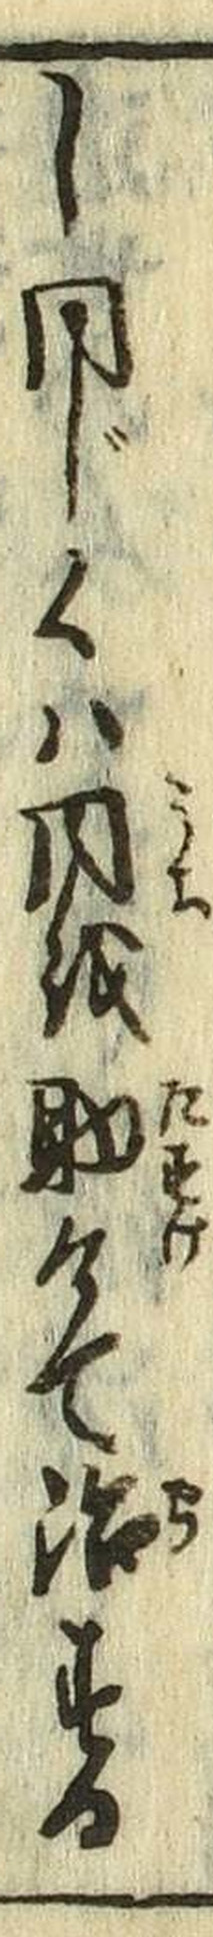し同じくは内を助て治する
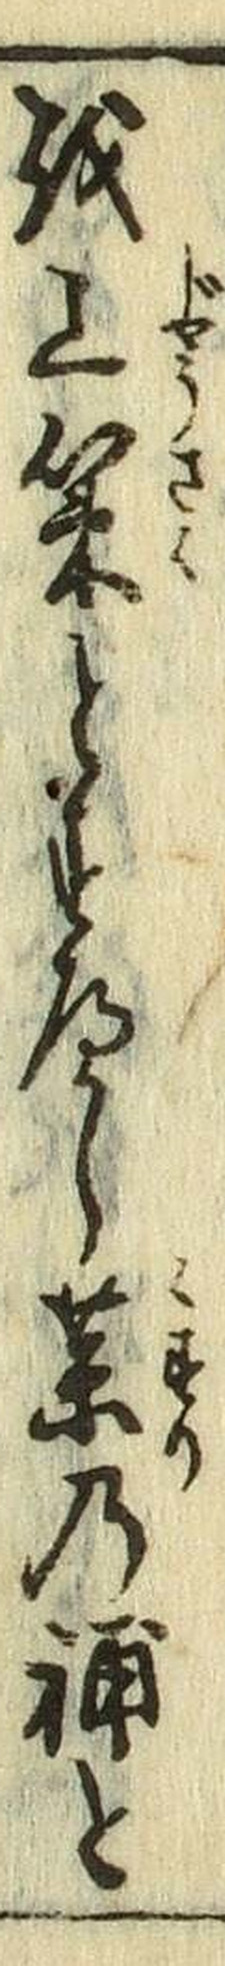を上策とすへし薬の補と
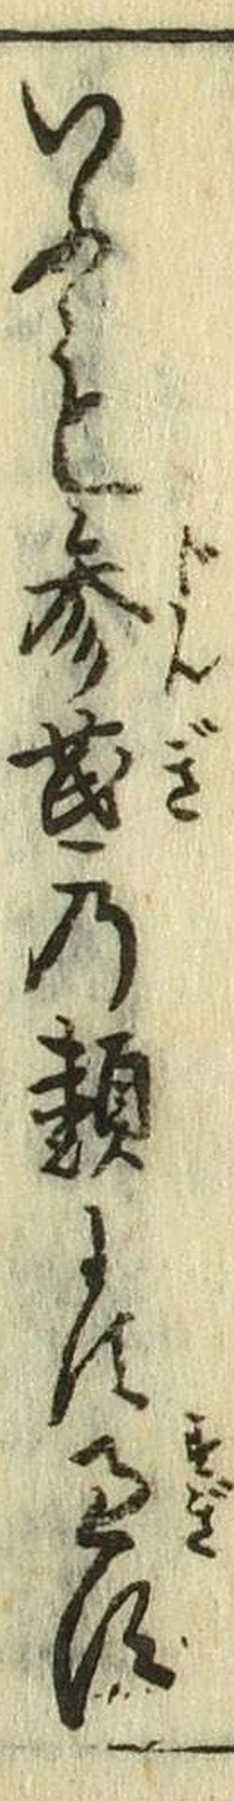いふも参茋の類には過す
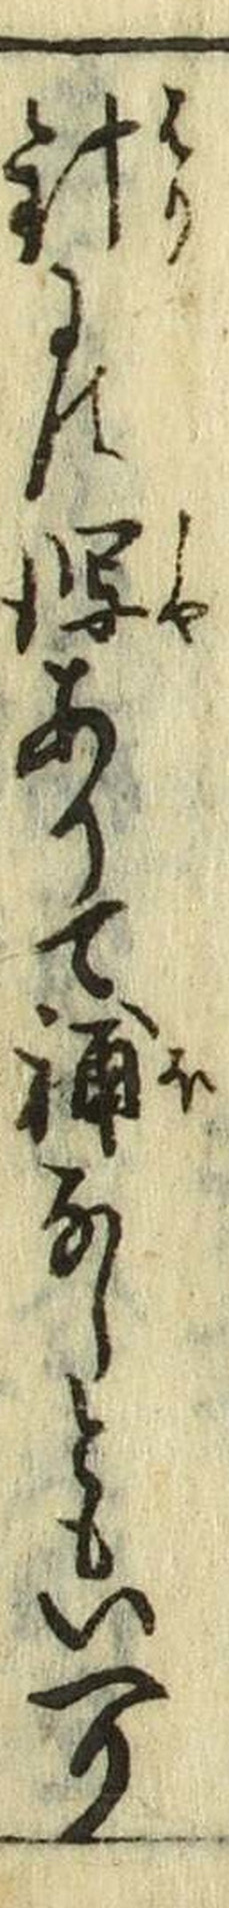針には瀉ありて補なしともいへり
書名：居家養生記
